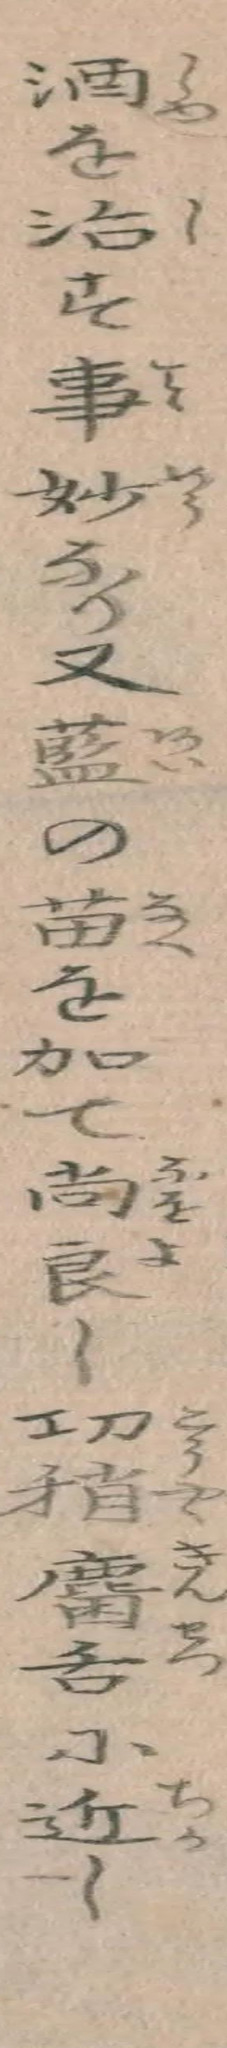酒を治す事妙なり又藍の苗を加て尚良し功稍麕舌に近し
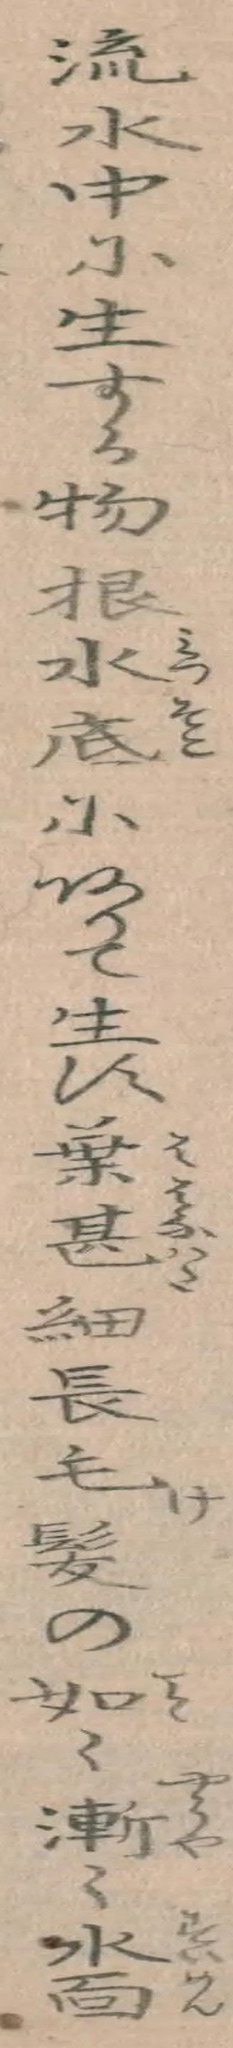流水中に生する物根水底にありて生す葉甚細長毛髪の如く漸く水面
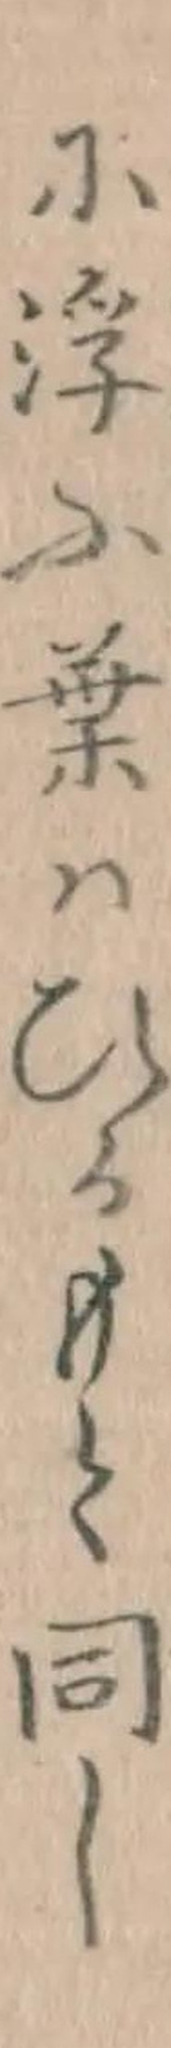に浮ふ葉はひるもと同し

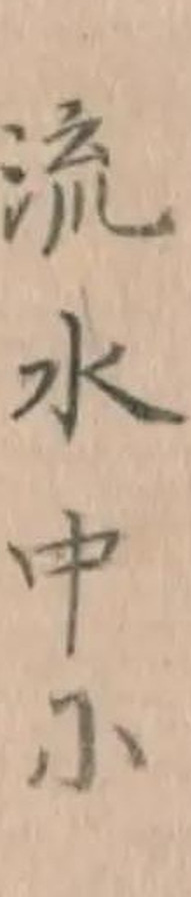流水中に
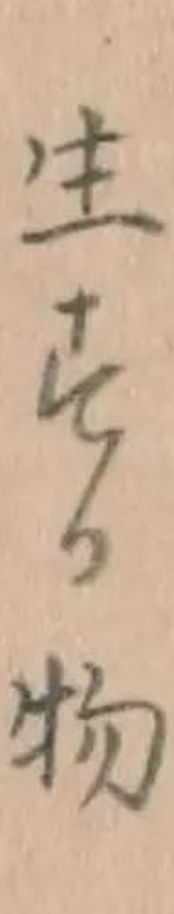生する物

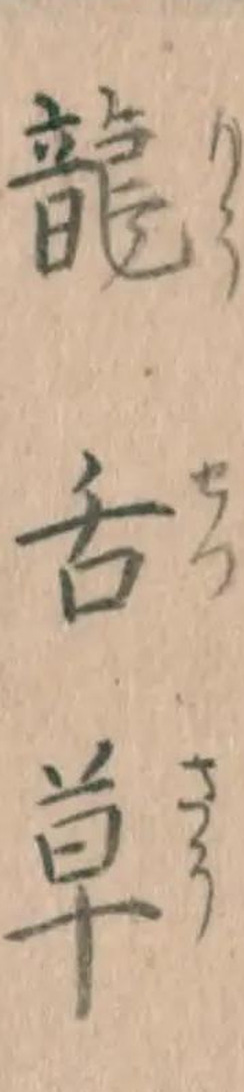竜舌草
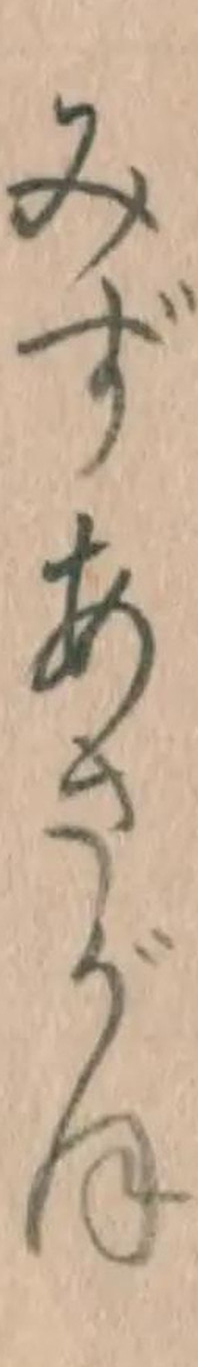みずあさがほ
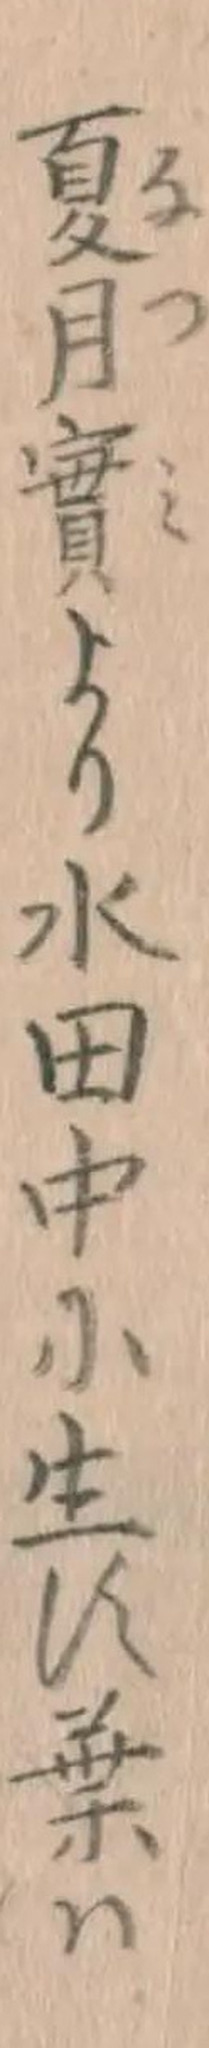夏月実より水田中に生す葉は
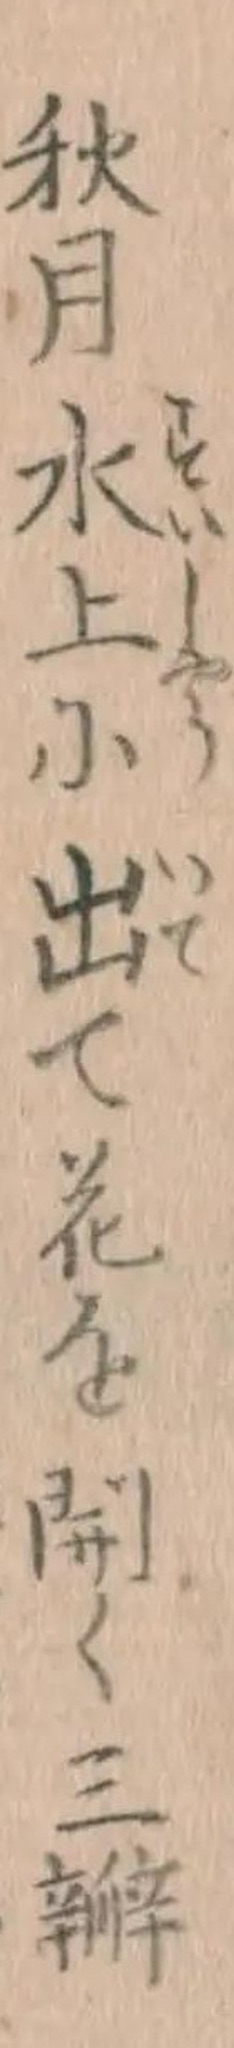秋月水上に出て花を開く三弁
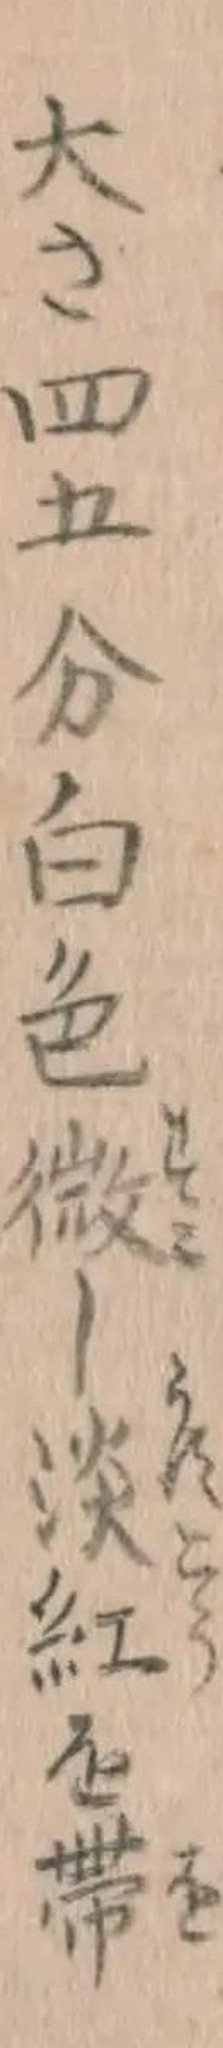大さ四五分白色微し淡紅を帯
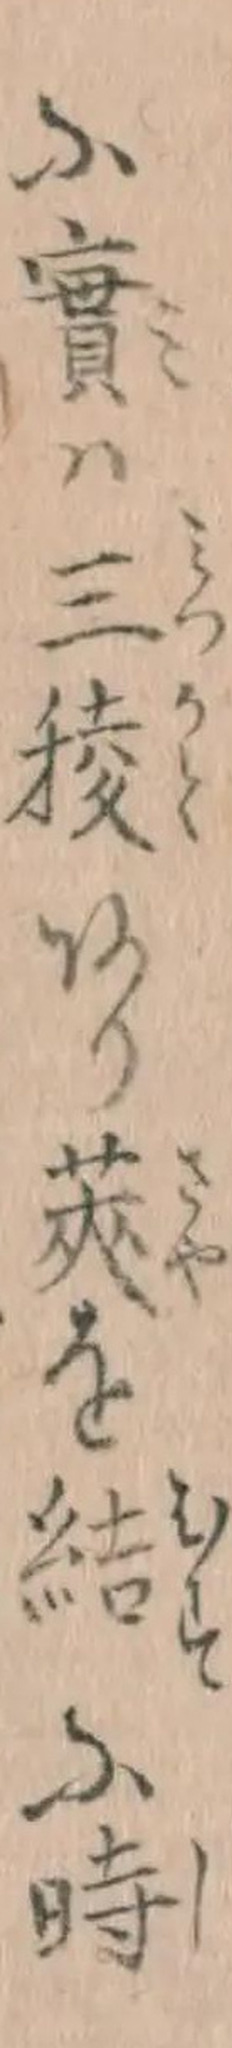ふ実は三稜あり莢を結ふ時
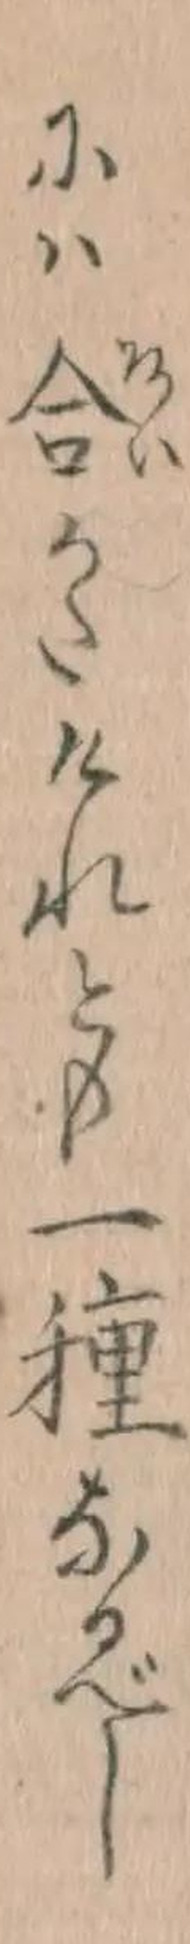には合かたけれとも一種なるべし
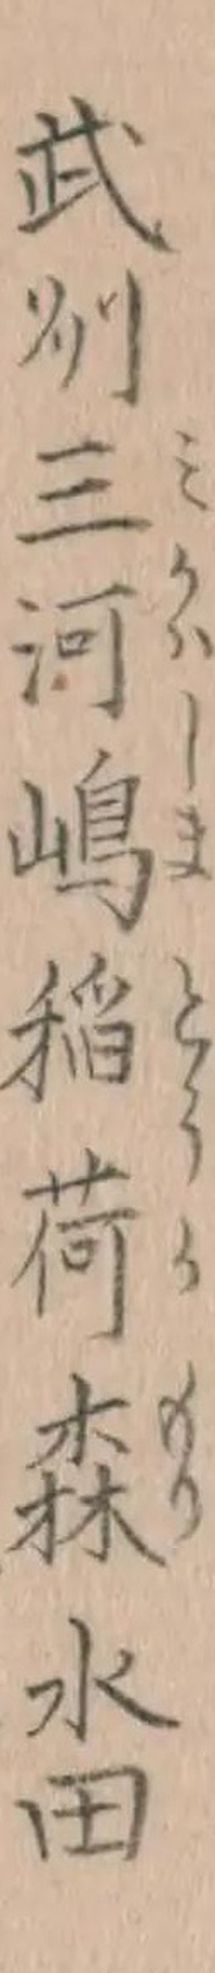武州三河嶋稲荷森水田
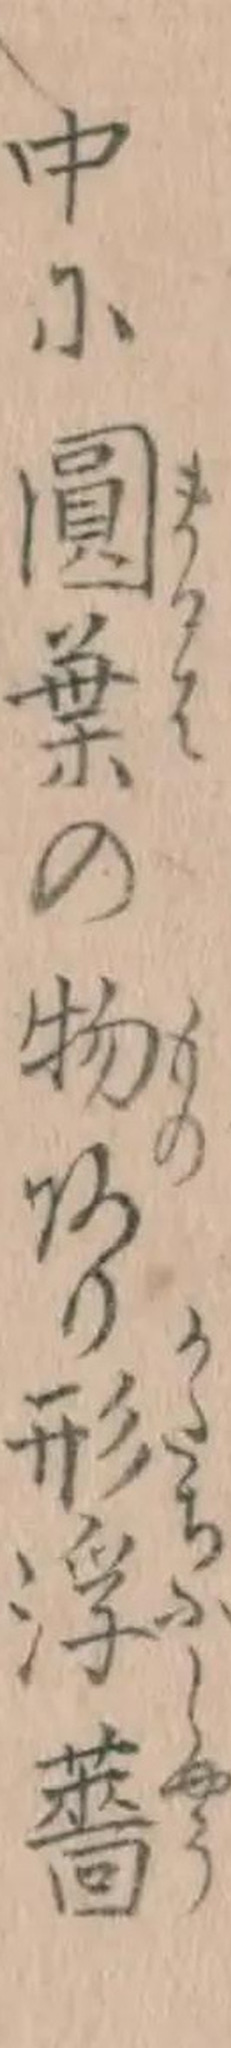中に円葉の物あり形浮薔
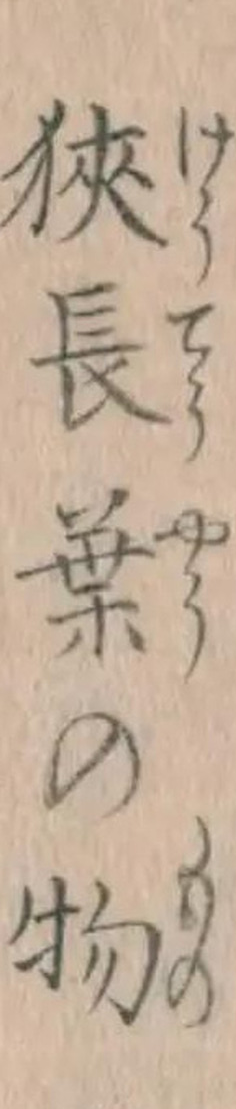狭長葉の物

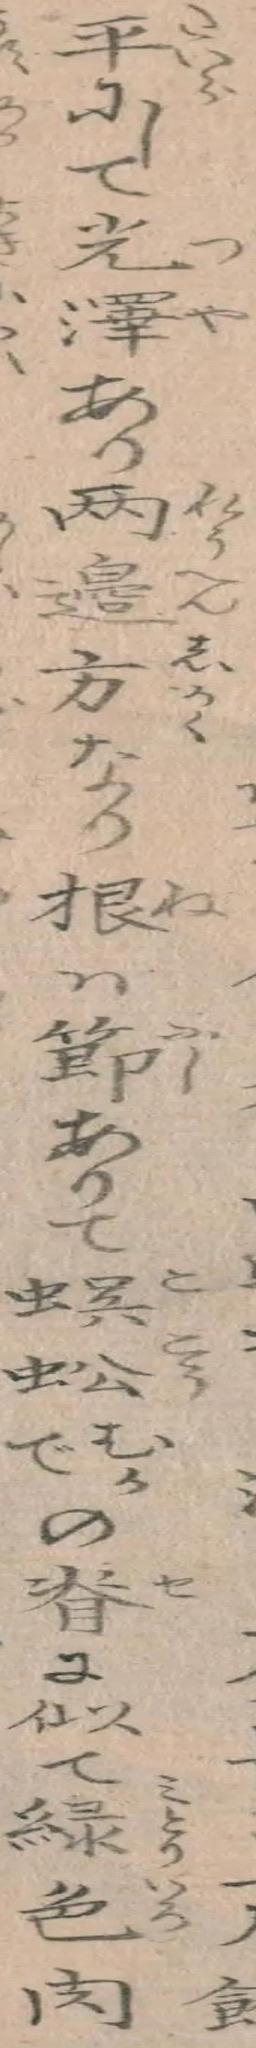平にして光沢あり両辺方なり根は節ありて蜈蚣むかでの脊に似て緑色内
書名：本草図譜. 巻31-33
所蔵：国立国会図書館 National Diet Library, JAPAN
